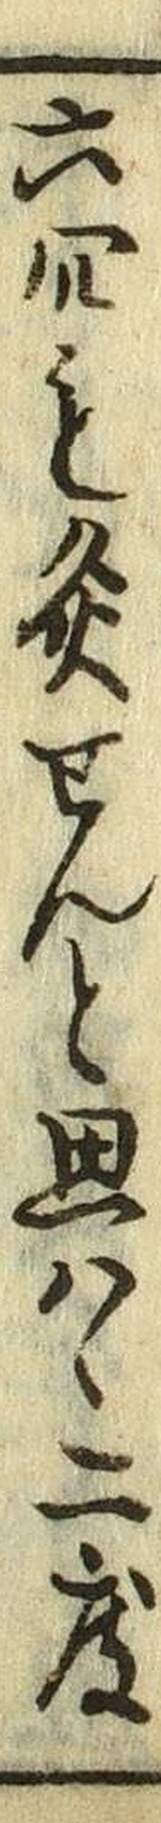六穴も灸せんと思はゝ二度
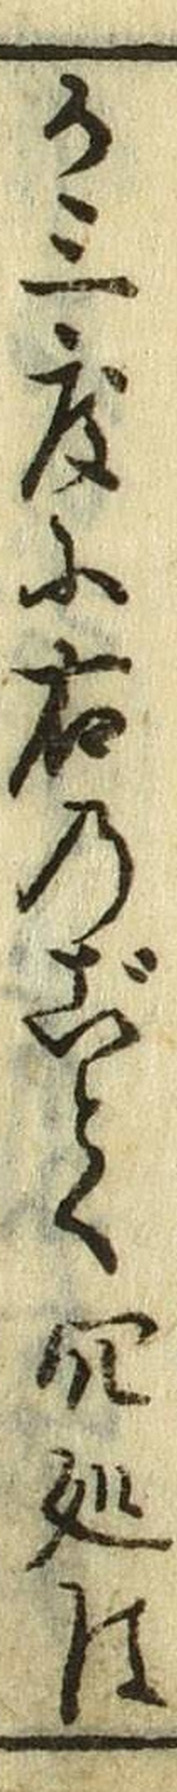か三度に右のごとく穴処は
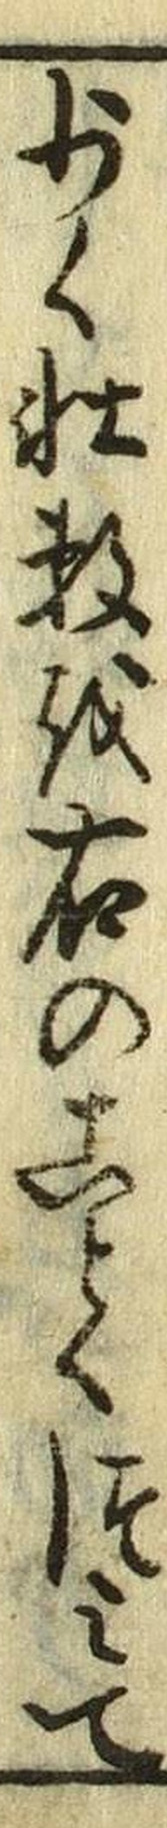少く壮数を右のことくつみて
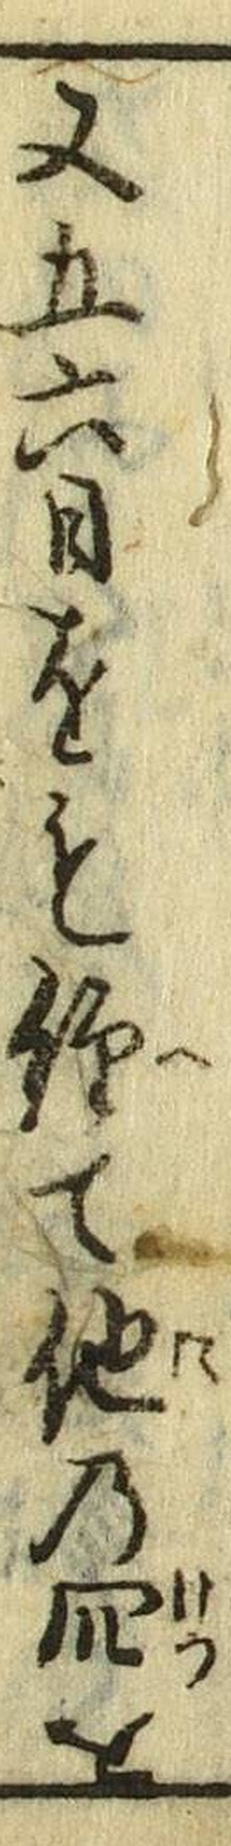又五六日をも経て他の穴を

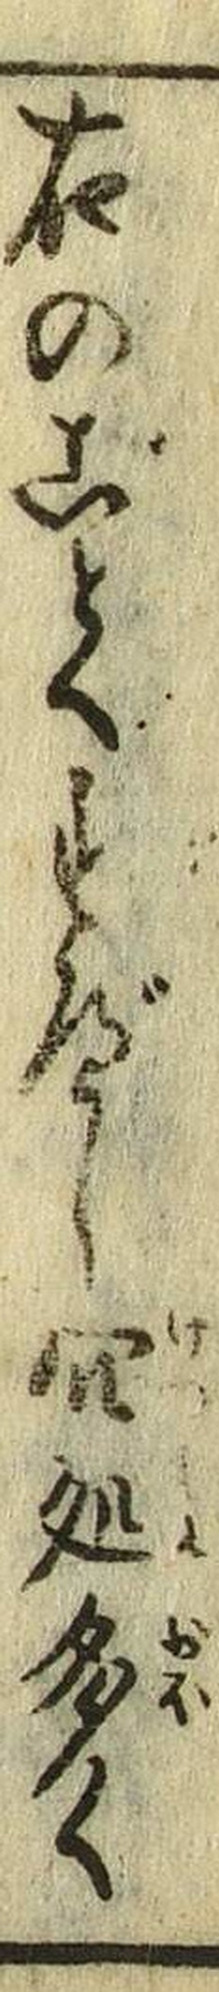右のごとくすべし穴処多く
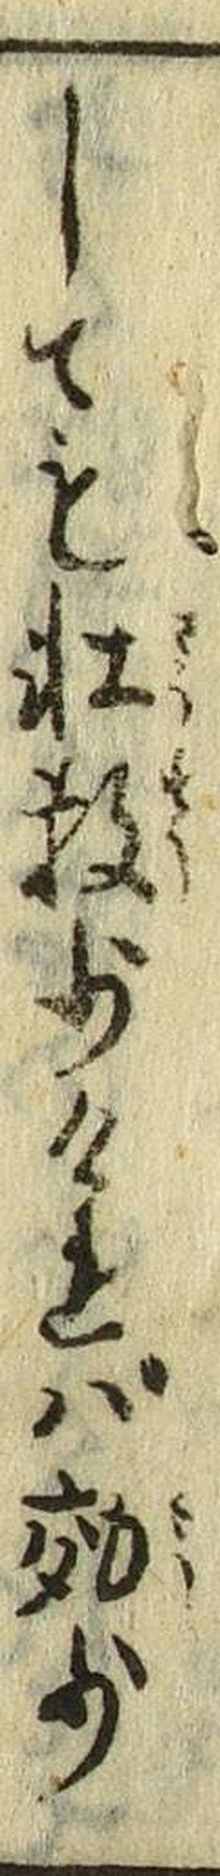しても壮数少ければ効少
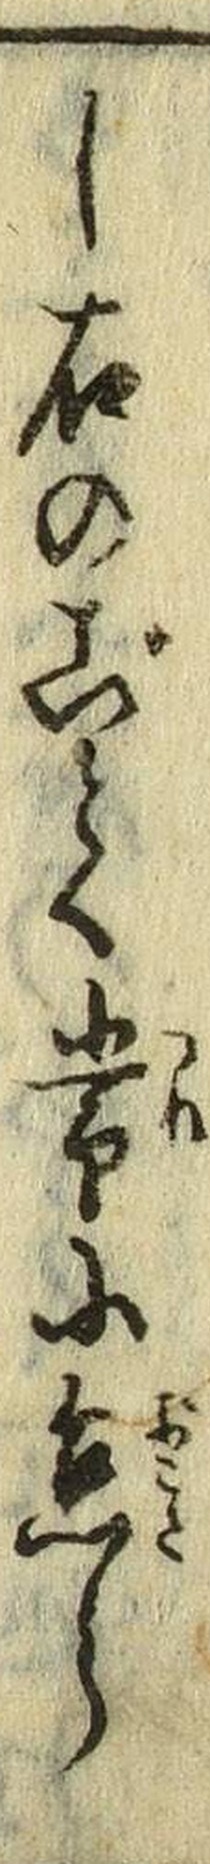し右のごとく常に怠ら
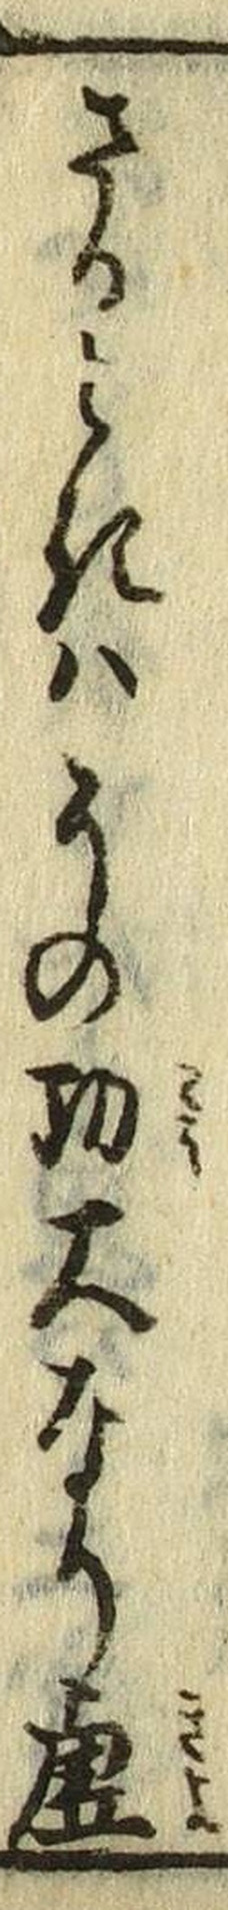さるときはその功大なり虚
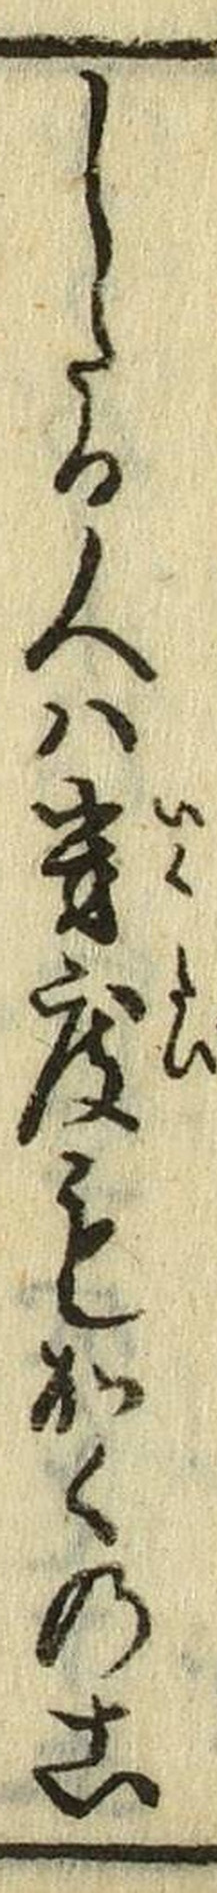したる人は幾度もかくのこ
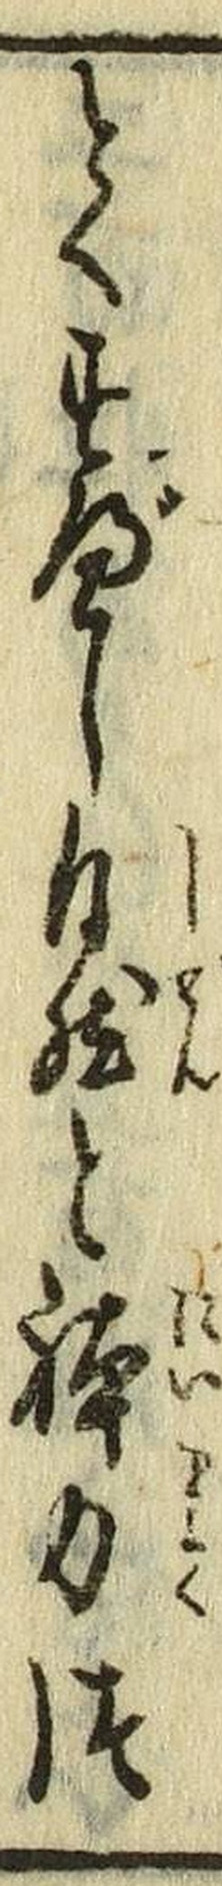とくすべし自然と体力つ
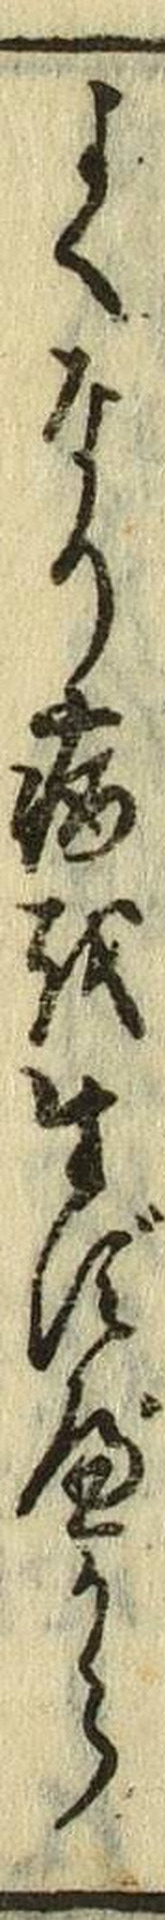よくなり病を生ずべから
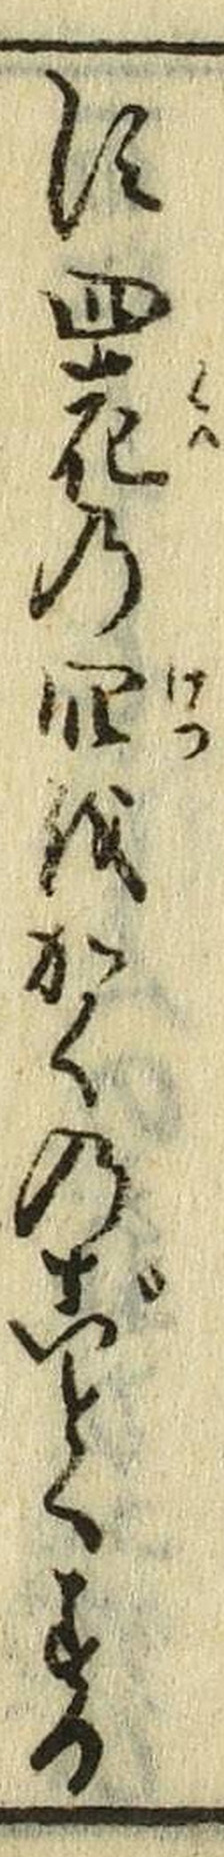す四花の穴をかくのごとくする
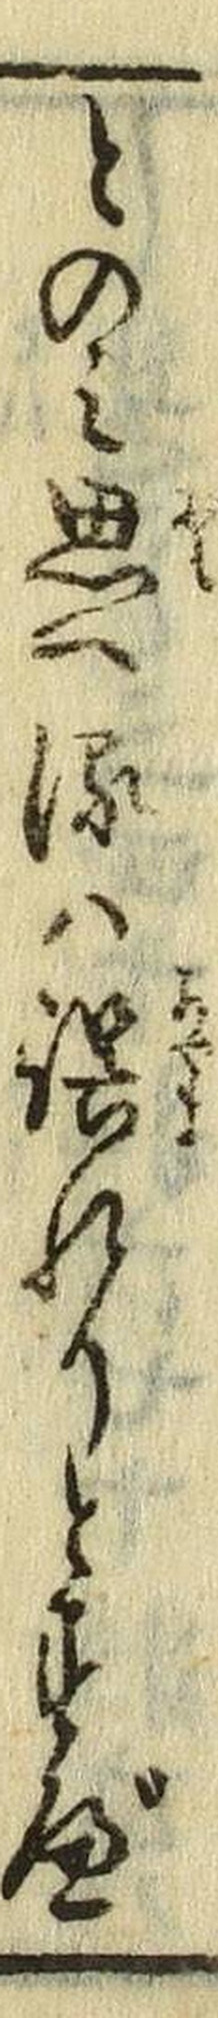とのみ思へるは誤れりとすべ
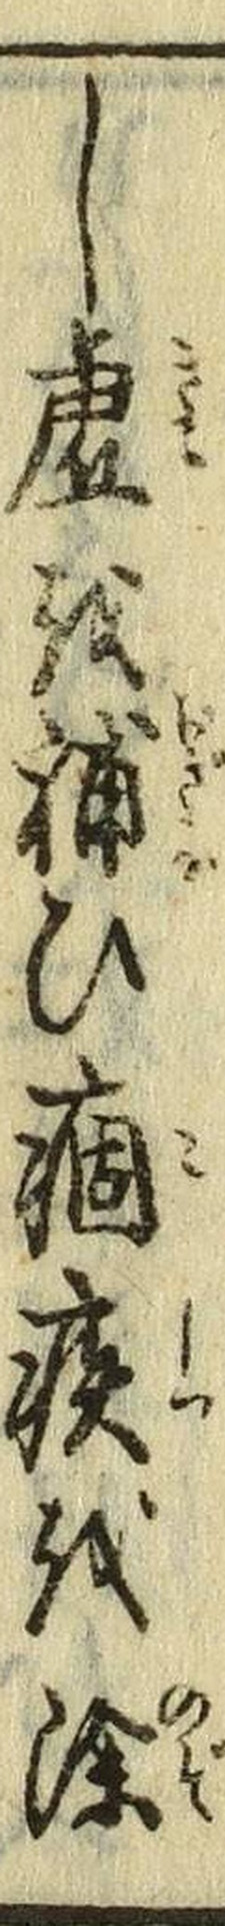し虚を補ひ痼疾を除
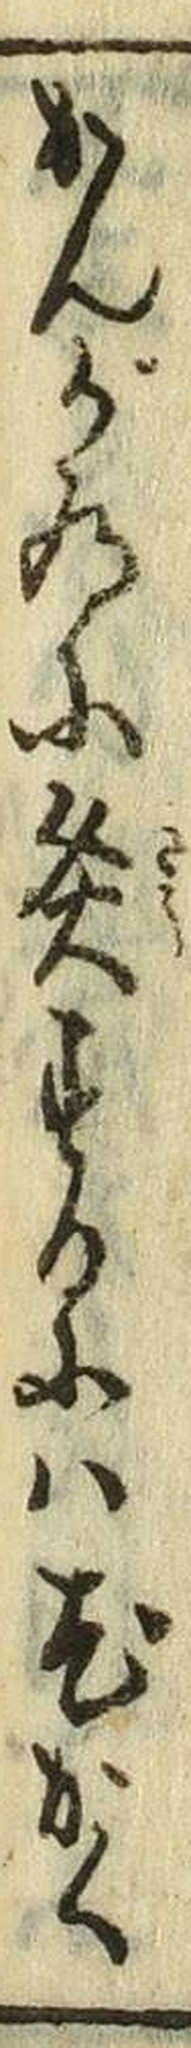かんが為に灸するには尤かく
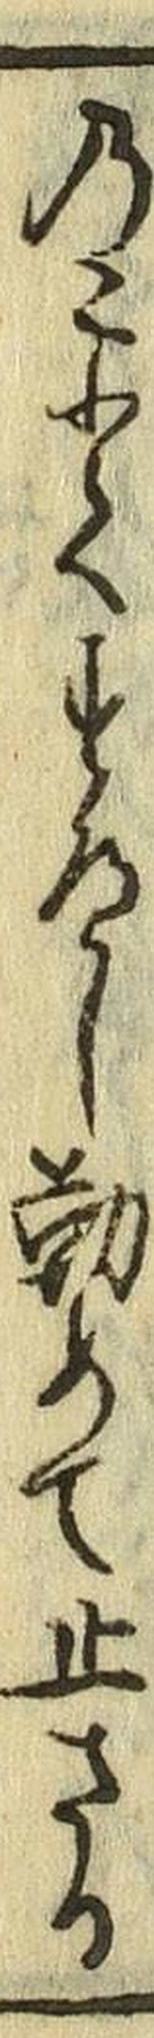のごとくすべし勤めて止さる
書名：居家養生記
